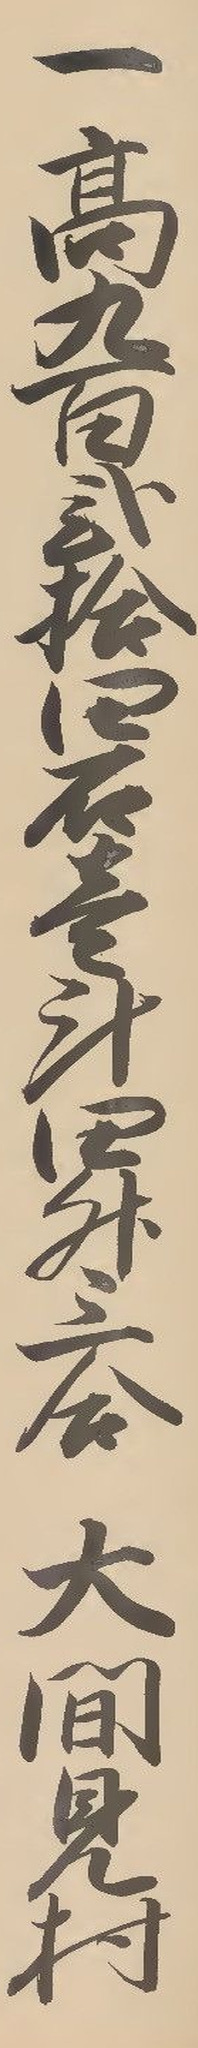一高九百弐拾四石壱斗四升三合大間見村
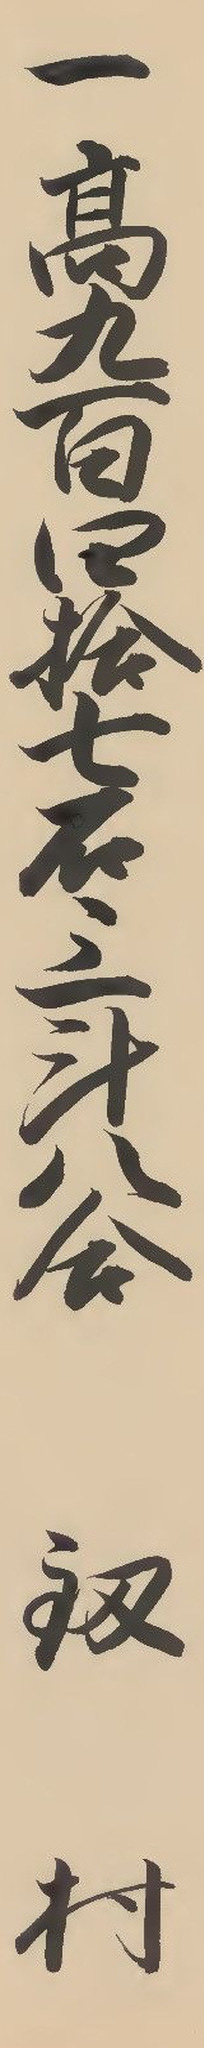一高九百四拾七石三斗八合剱村
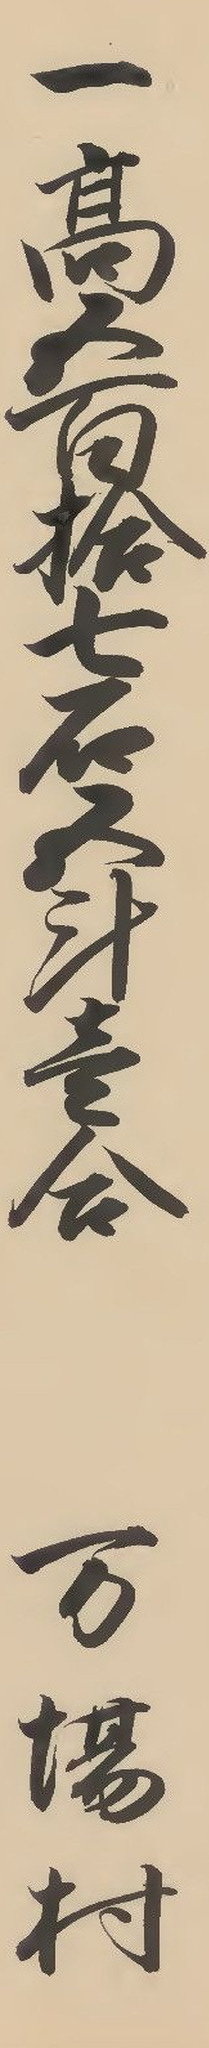一高五百拾七石五斗壱合万場村
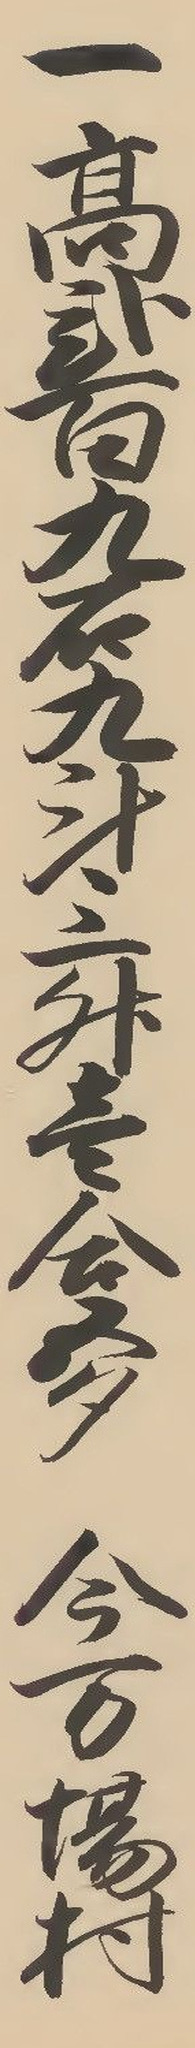一高弐百九石九斗三升壱合五勺今万場村

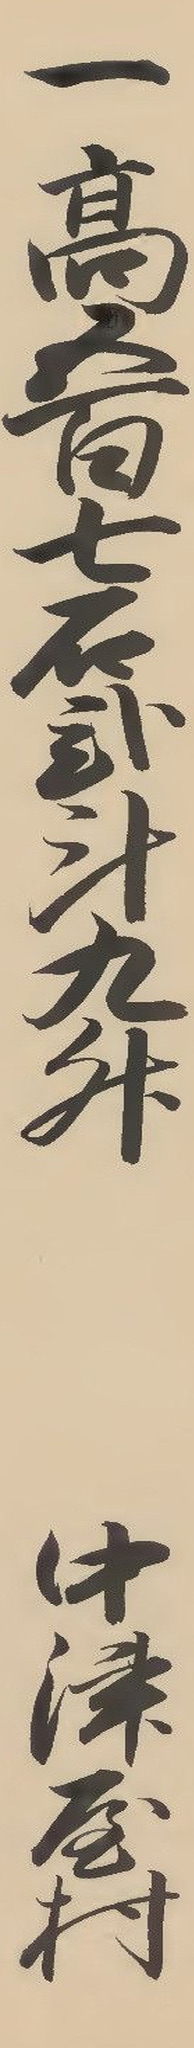一高五百七石弐斗九升中津屋村
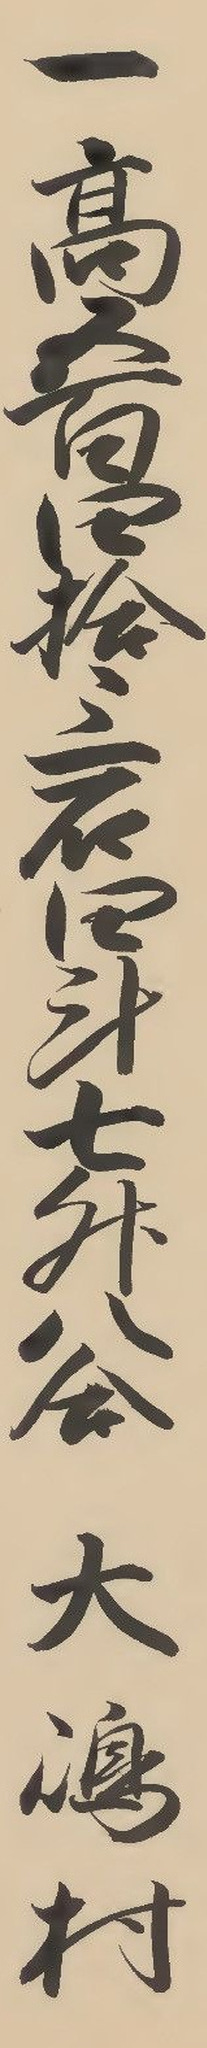一高五百四拾三石四斗七升八合大島村
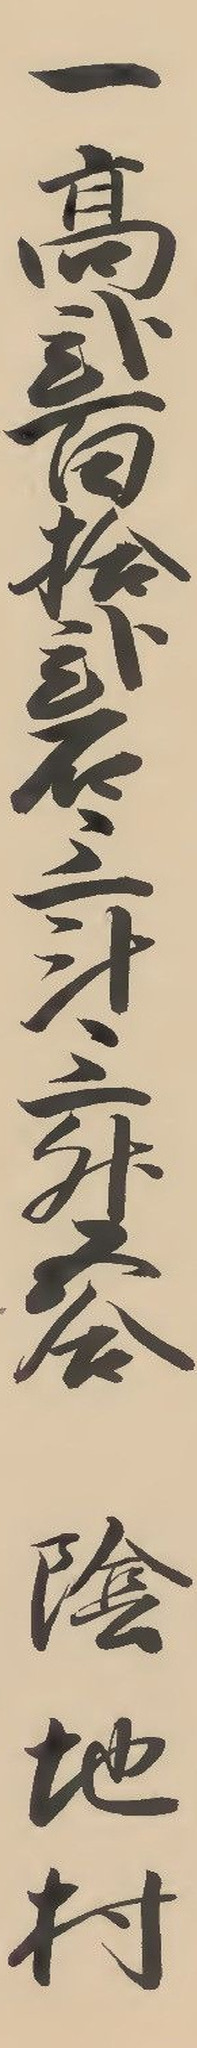一高弐百拾弐石三斗三升五合陰地村
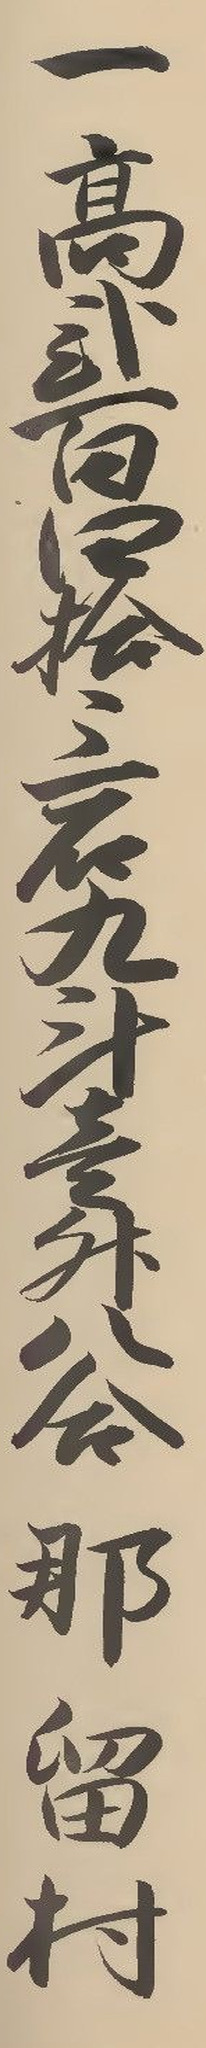一高弐百四拾三石九斗壱升八合那留村
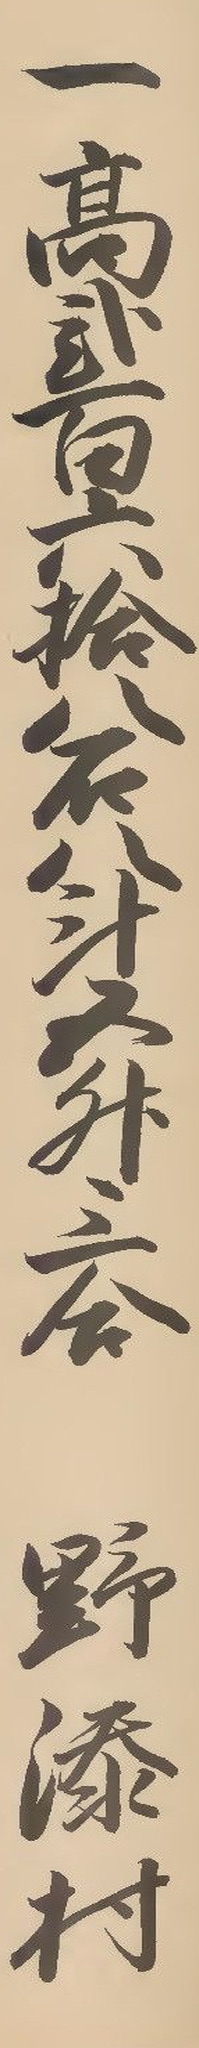一高弐百六拾八石八斗五升三合野添村
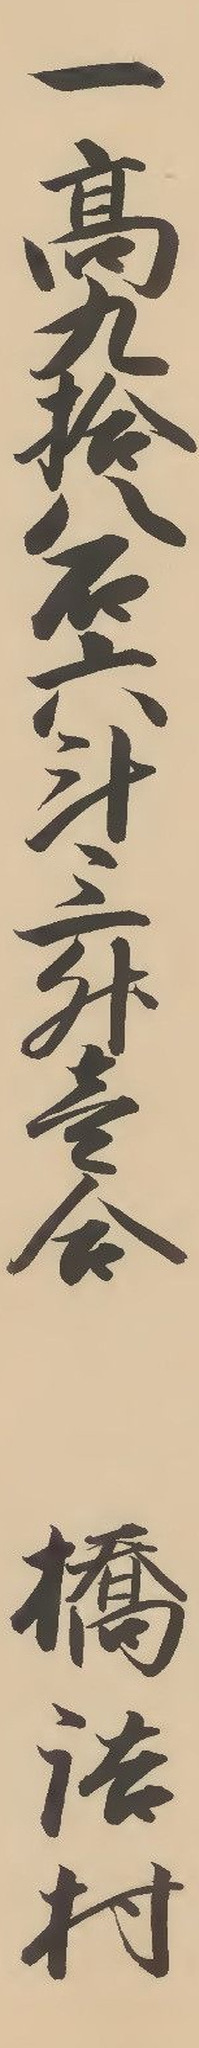一高九拾八石六斗三升壱合橋詰村
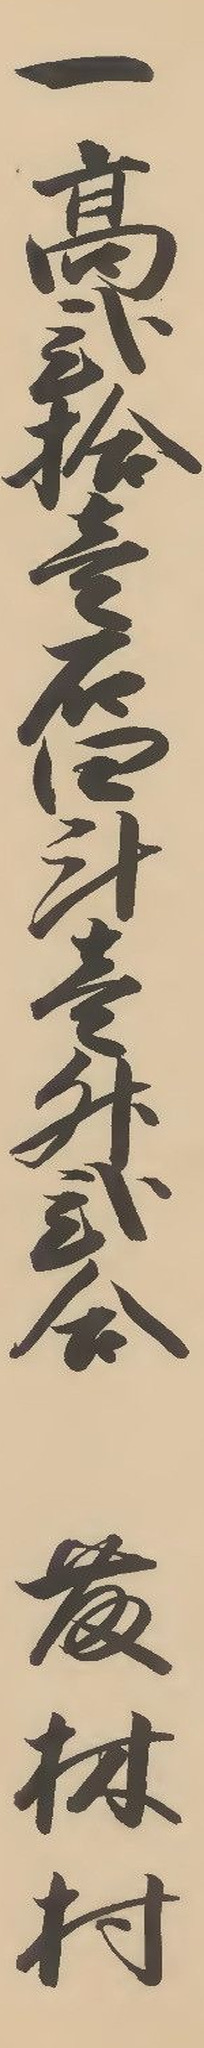一高弐拾壱石四斗壱升弐合藤林村
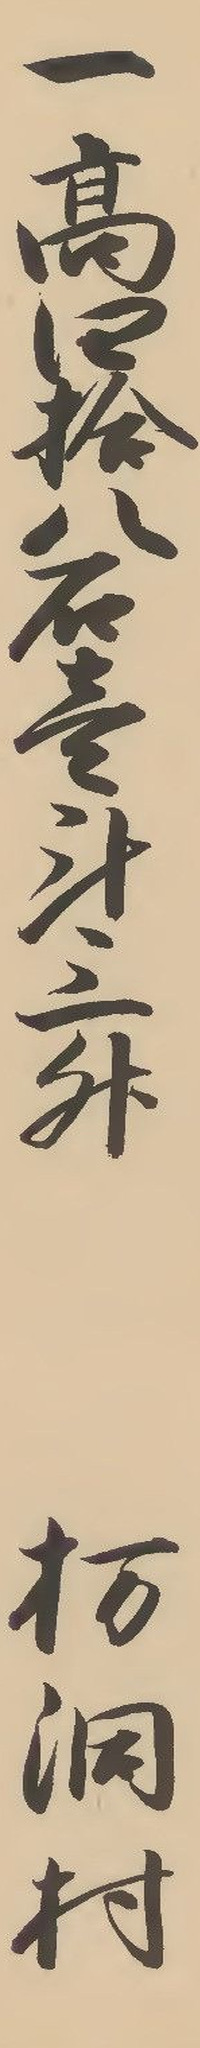一高四拾八石壱斗三升栃洞村

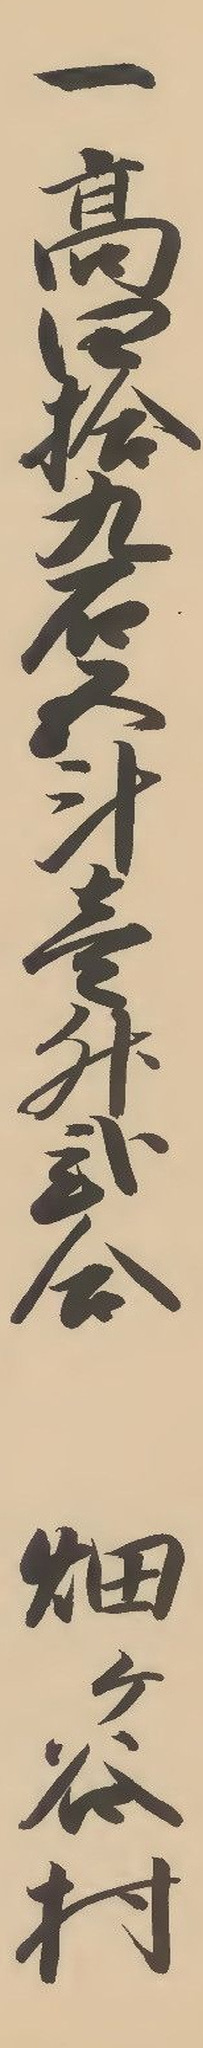一高四拾九石五斗壱升弐合畑ヶ谷村
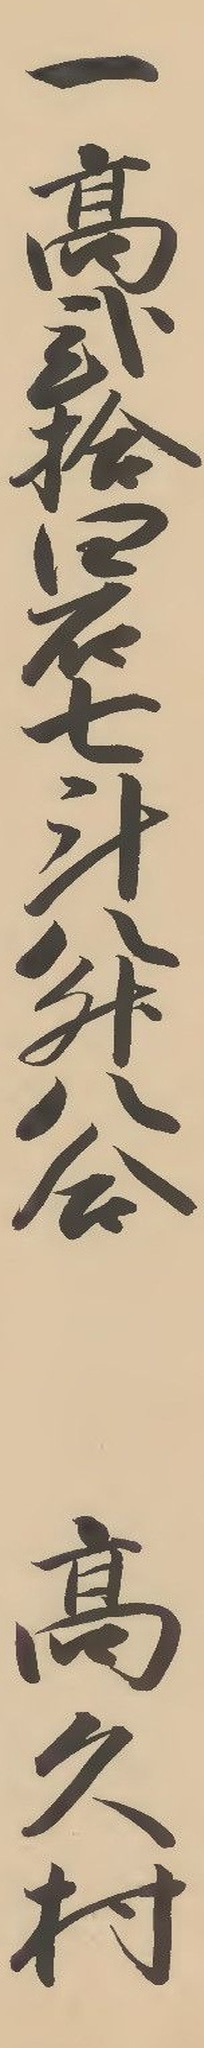一高弐拾四石七斗八升八合高久村
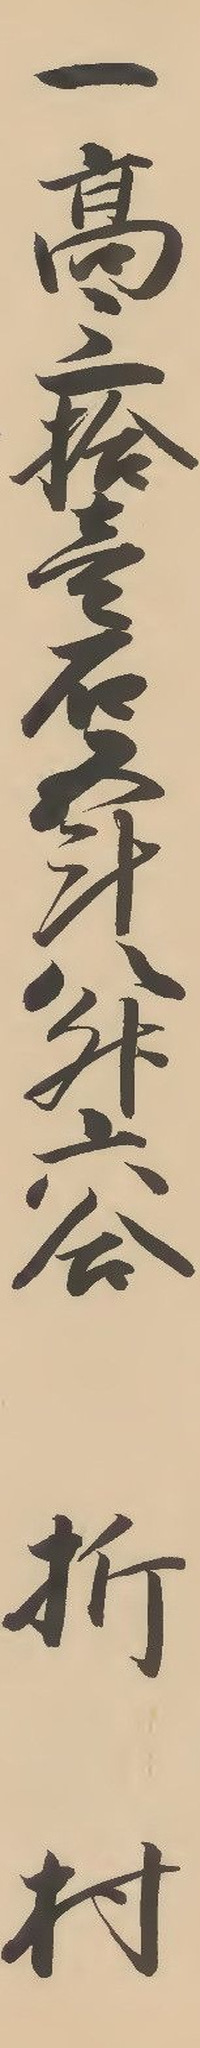一高三拾壱石五斗八升六合折村
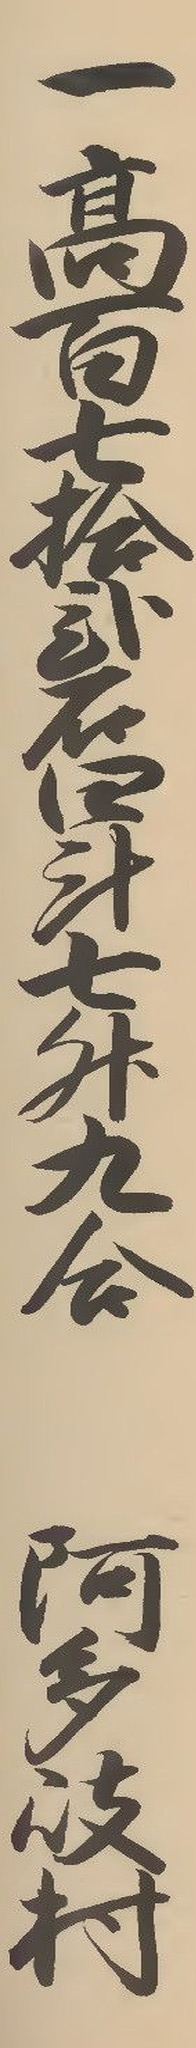一高百七拾弐石四斗七升九合阿多岐村
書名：美濃国郷帳
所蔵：国立公文書館 National Archives of Japan
